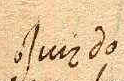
o Juiz do
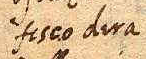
fisco dira
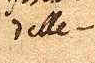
delle
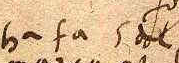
ha fa 5 de
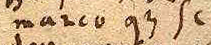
março 93 se
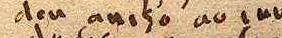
deu auiso ao iuiz
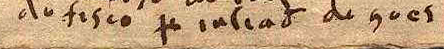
do fisco ꝑ iuliaõ de goes
